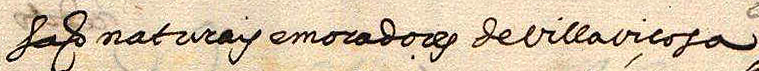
saõ naturais e moradores de villa viçosa
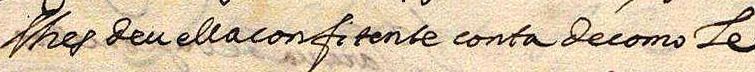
lhes deu ella confitente conta de como Le
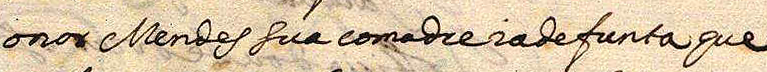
onor Mendes sua comadre ia defunta que
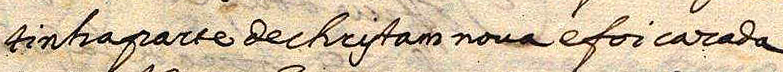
tinha parte de christam noua e foi cazada
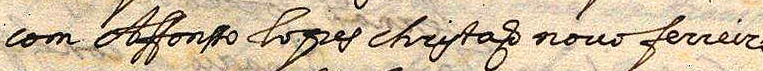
com Affonsso lopes christaõ nouo ferreiro
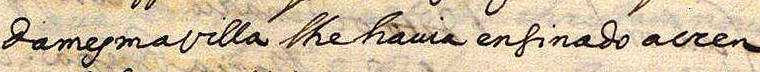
da mesma villa lhe hauia ensinado a cren
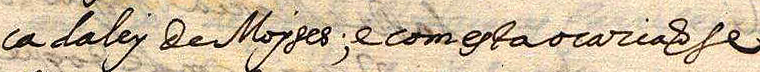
ça da ley de Moyses; e com esta ocaziaõ se
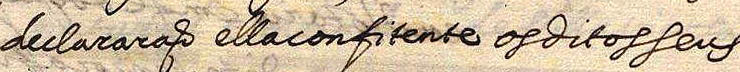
declararaõ ella confitente os ditos seus
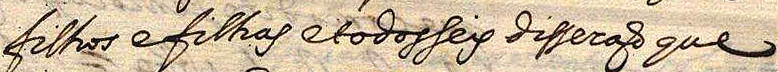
filhos e filhas e todos seis disseraõ que
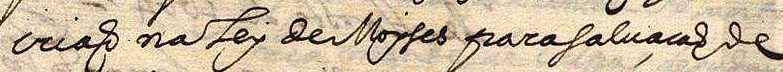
criaõ na Ley de Moyses para saluaçaõ de
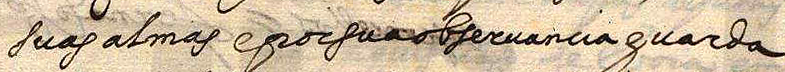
suas almas e por sua obseruancia guarda
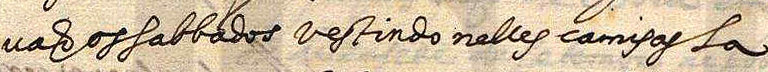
uaõ os sabbados vestindo nelles camisas La
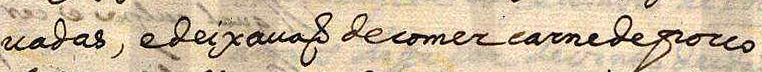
uadas, e deixauaõ de comer carne de porco
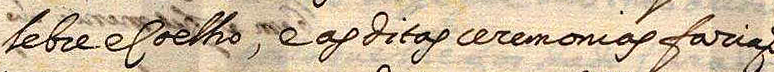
lebre e Coelho, e as ditas ceremonias faziaõ
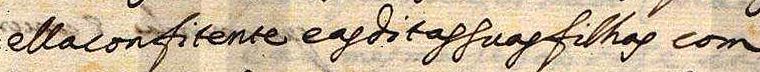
ella confitente e as ditas suas filhas com
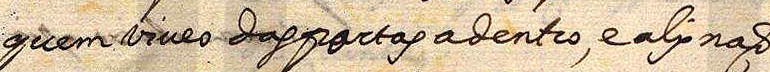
quem viueo das portas adentro, e aly naõ
